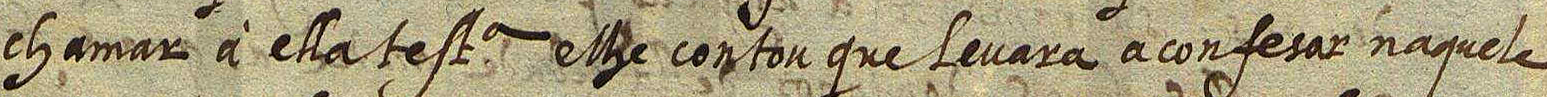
chamar a ella testa e lhe contou que leuara a confesar naquele
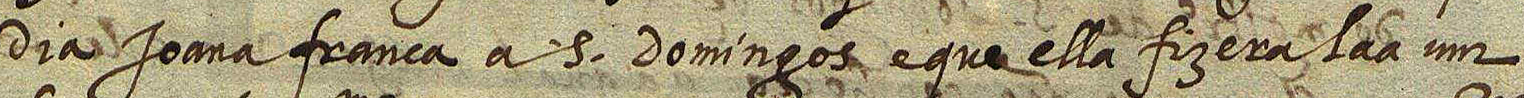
dia Joana franca a .s. Domingos e que ella fizera laa um
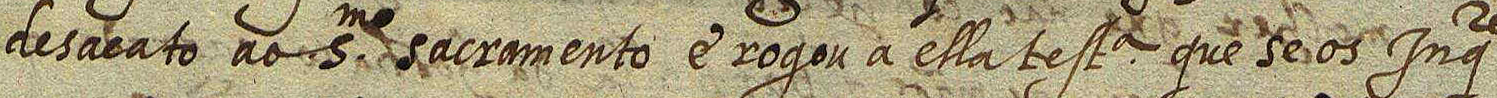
desacato ao s.mo sacramento e rogou a ella testa. que se os Jnqres
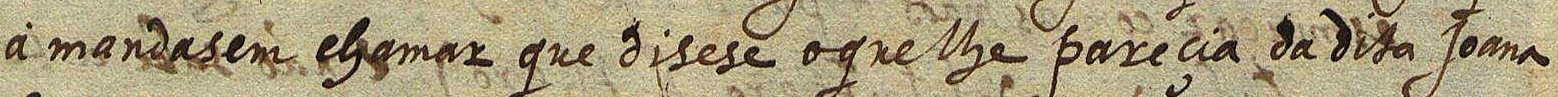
a mandasem chamar que disese o que lhe pareçia da dita Joana
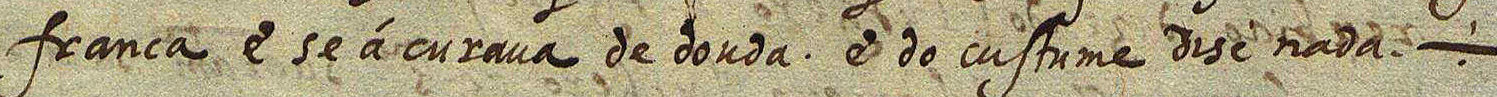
franca e se á curaua de douda. e do custume dise nada.
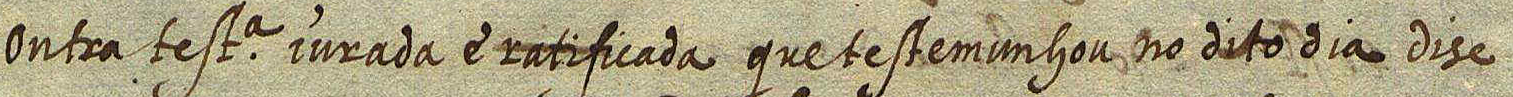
outra testa. iurada e ratificada que testemunhou no dito dia dise
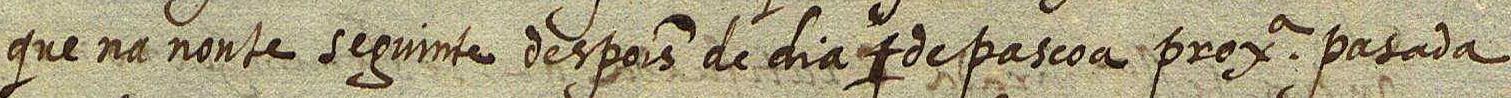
que na noute seguinte despois de dia _ de pascoa prox.a pasada
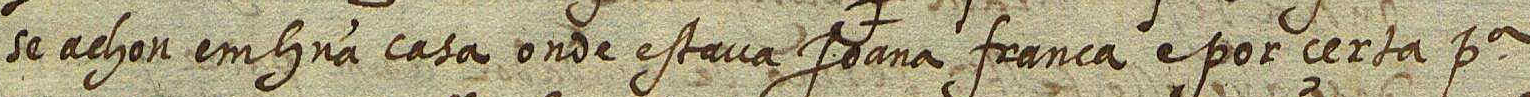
se achou em huā casa onde estaua Joana franca e por çerta pa
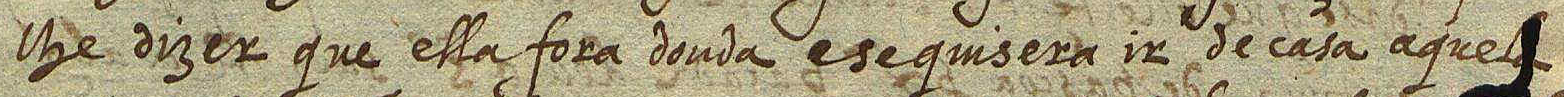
lhe dizer que ella fora douda e se quisera ir de casa aquela
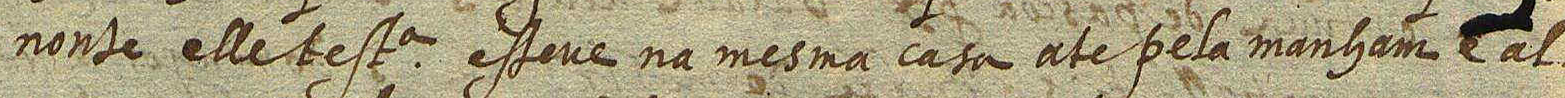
noute elle testa. esteue na mesma casa ate pela manham e al
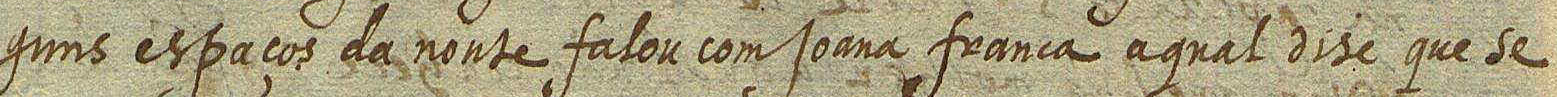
guns espaços da noute falou com Joana franca a qual dise que se
